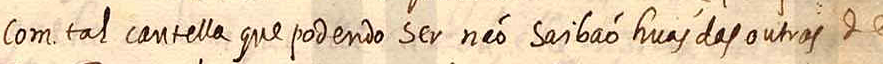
com tal cautella que podendo ser naõ saibaõ huas das outras de
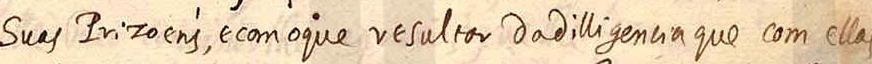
suas Prizoens, e com o que resultar da dilligencia que com ellas
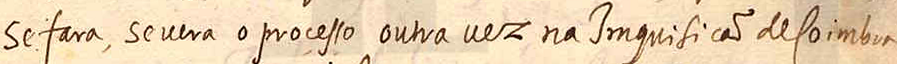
se fara, se uera o processo outra uez na Imquisiçaõ de Coimbra
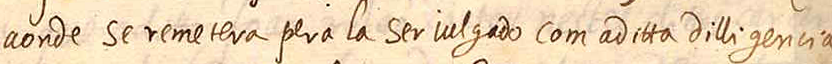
aonde se remetera pera la ser iulgado com a ditta dilligencia
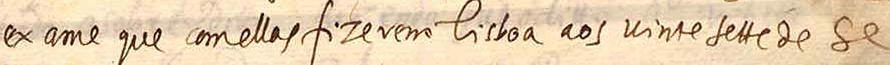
exame que com ellas fizerem lisboa aos uinte sette de se
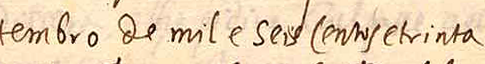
tembro de mil e seicentos e trinta.
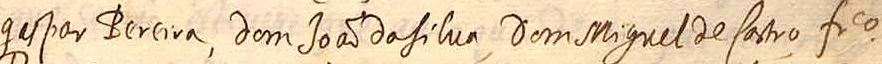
gaspar Pereira, dom Ioaõ da silua, Dom Miguel de Castro, frco.
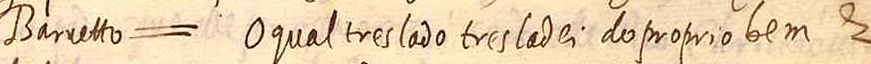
Barretto = O qual treslado tresladei do proprio bem E
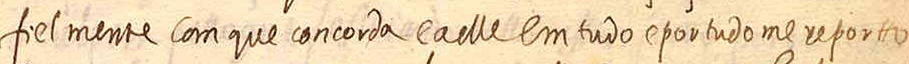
fielmente com que concorda e a elle em tudo e por tudo me reportto
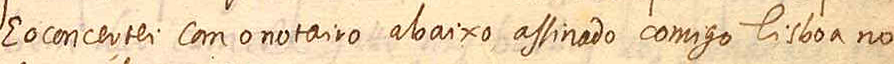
E o concertei com o notairo abaixo assinado comigo lisboa no
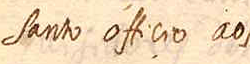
Santo offiçio aos
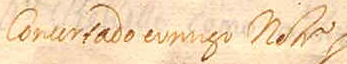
Concertado comigo Notr.o
